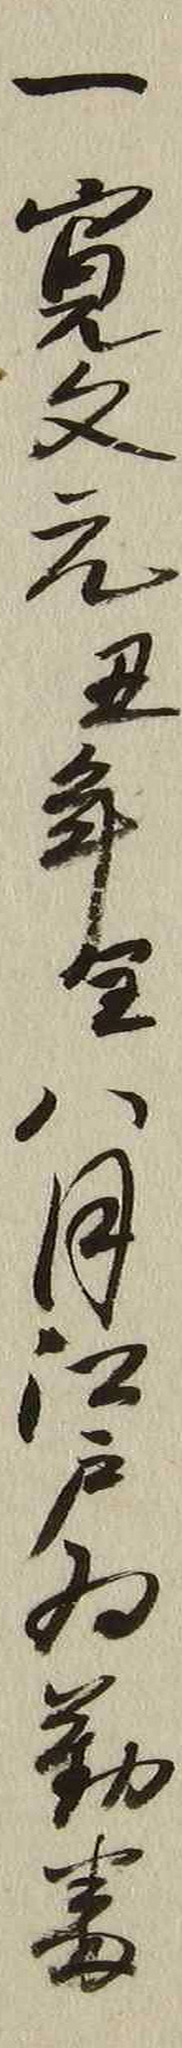一寛文元丑年閏八月江戸為勤番
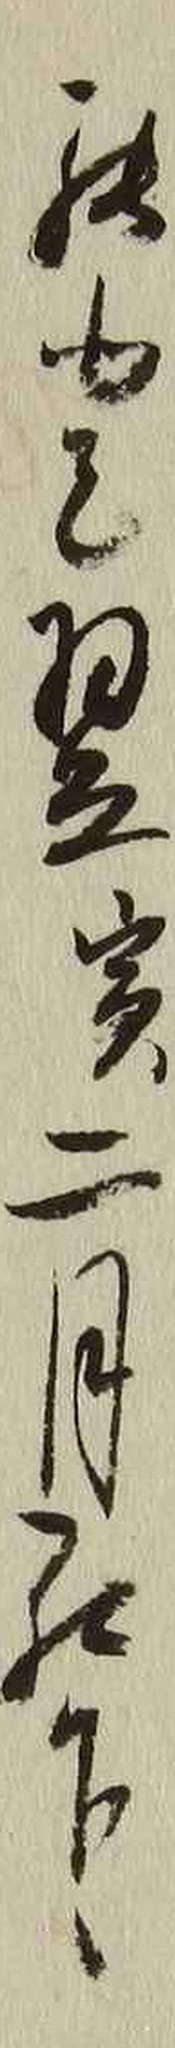罷登翌寅二月罷下候
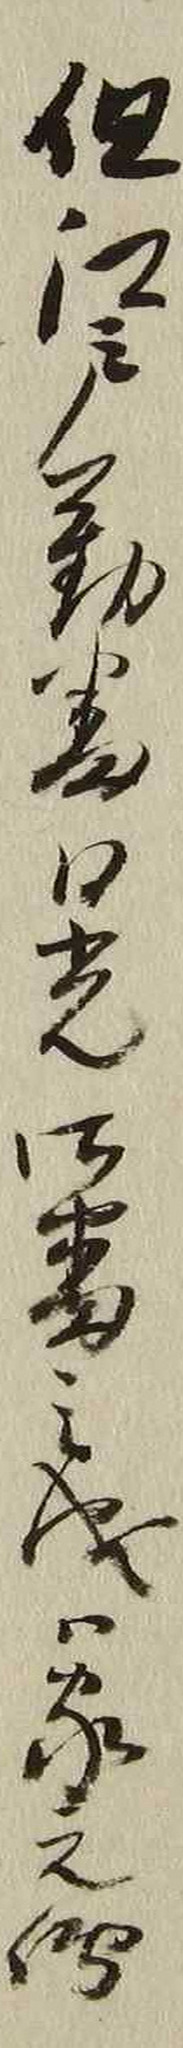但江戸勤番日光御番之儀ハ家元伝
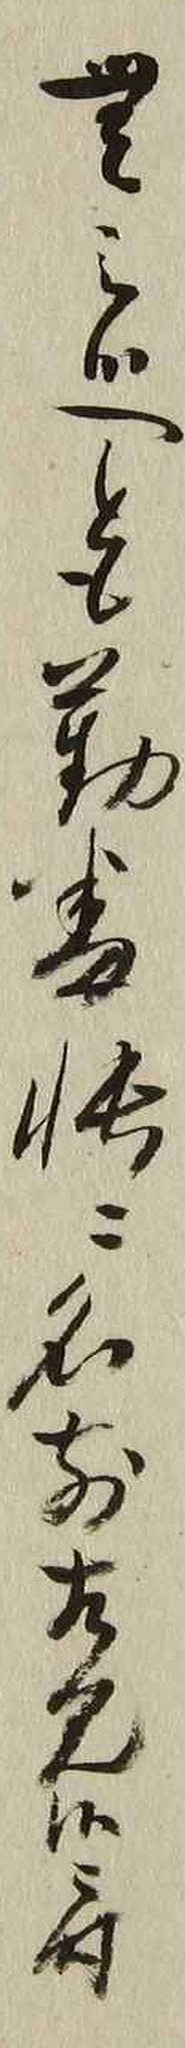無之候へとも勤番帳ニ名前相見候ニ付
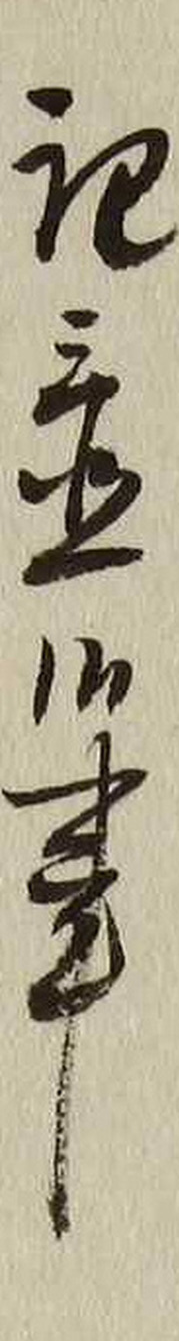記置候事
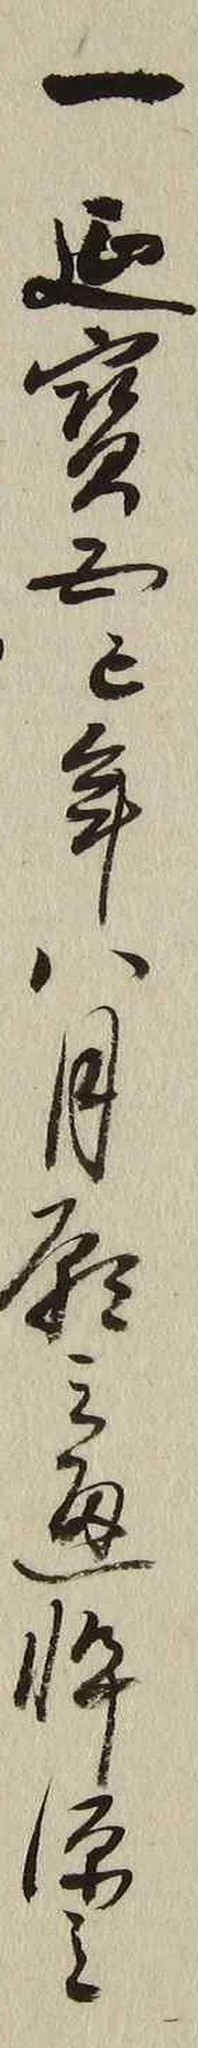一延宝五巳年八月願之通忰源之
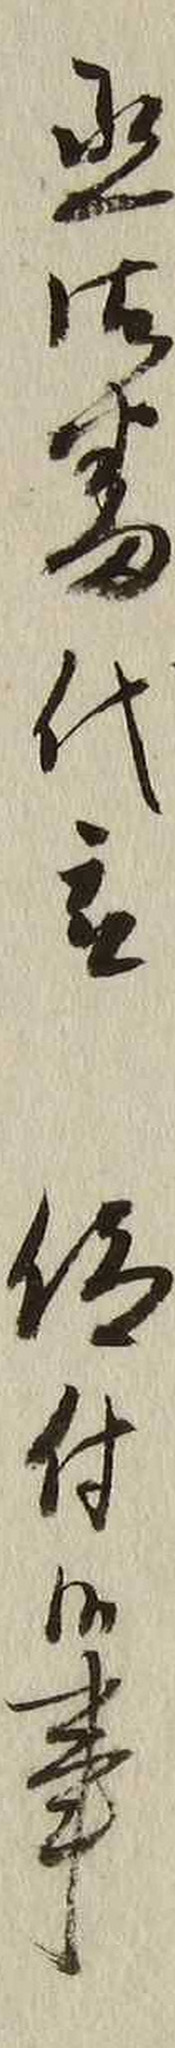丞御番代被仰付候事
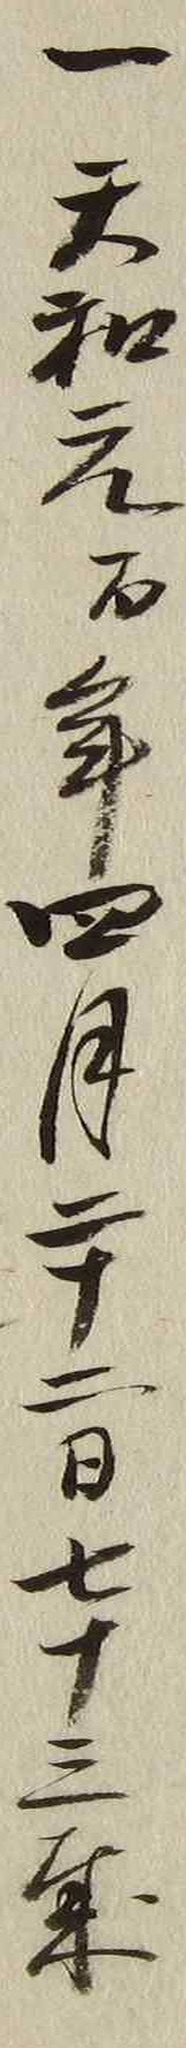一天和元酉年四月二十二日七十三歳
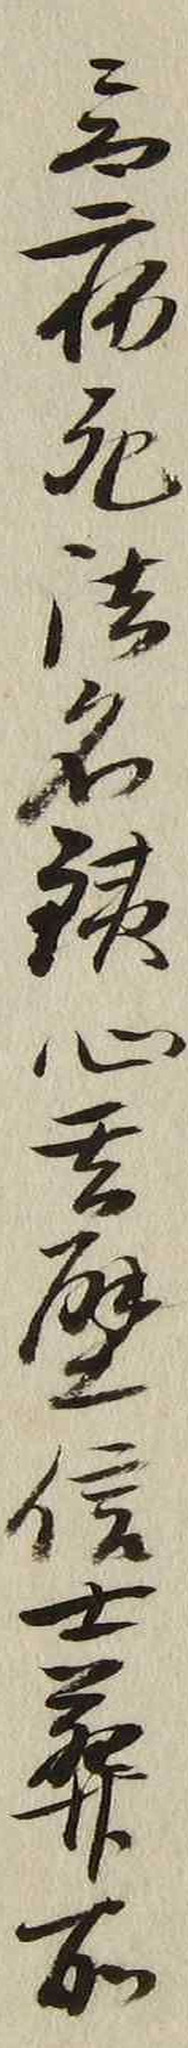ニ而病死法名鉄心玄壁信士葬所
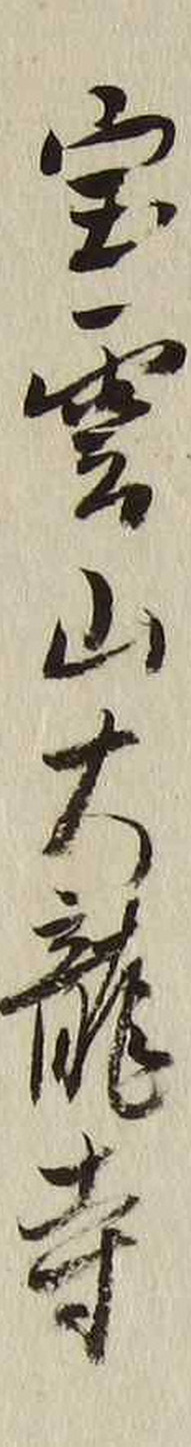宝雲山大龍寺
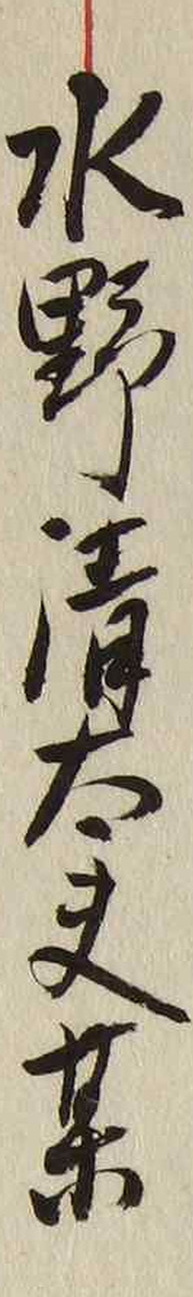水野清太夫某

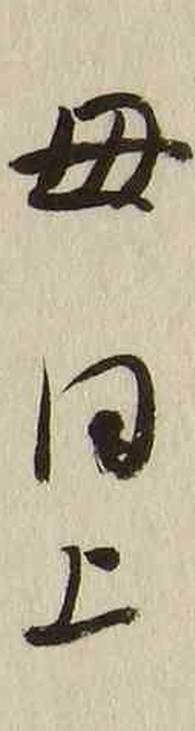母同上
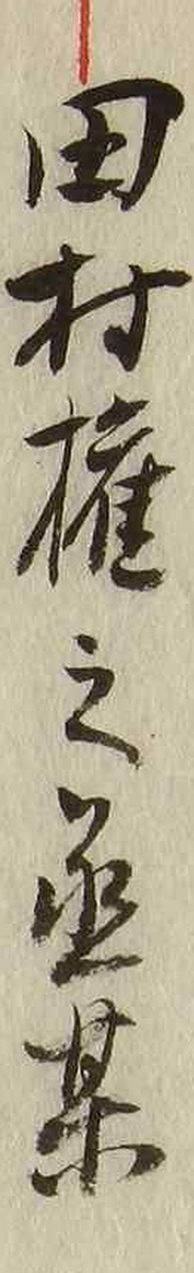田村権之丞某
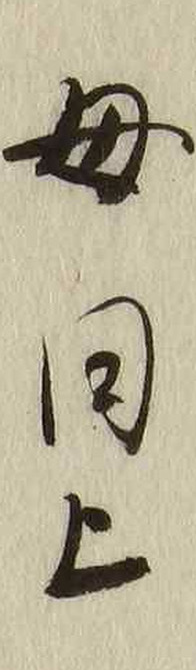母同上
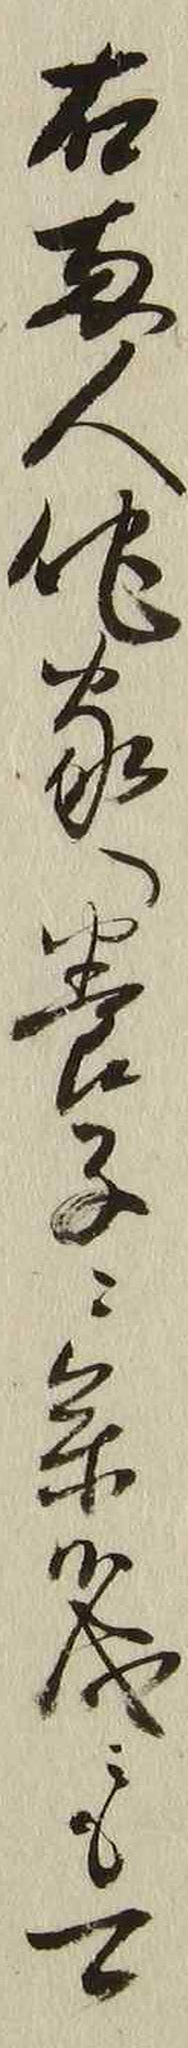右両人他家へ養子ニ参候儀ニも可
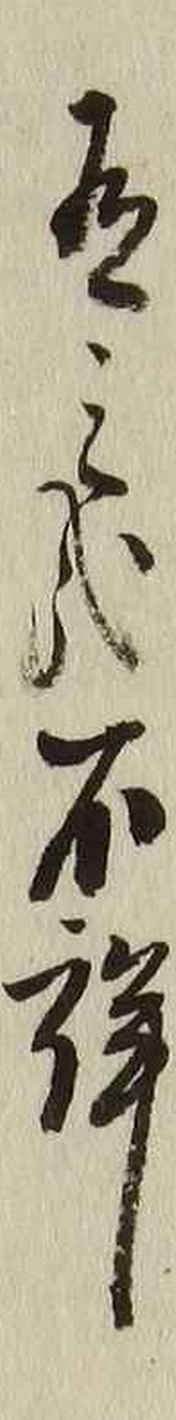有之哉不詳
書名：諸士系譜　巻之355　す之部5
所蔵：会津若松市立会津図書館
